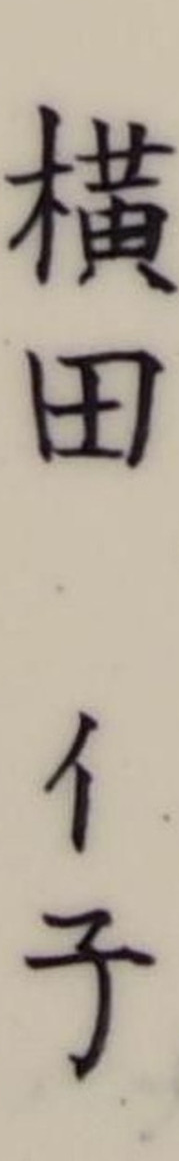横田イ子
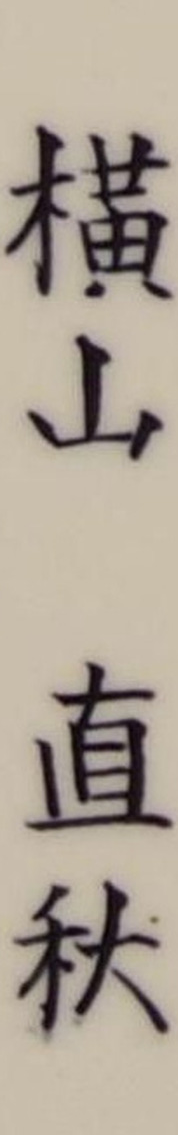横山直秋
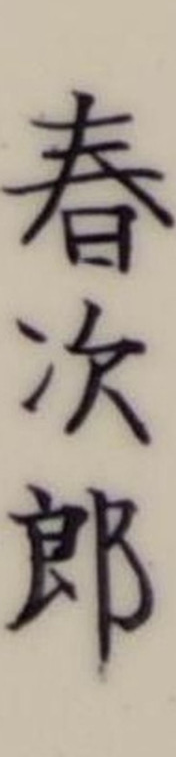春次郎
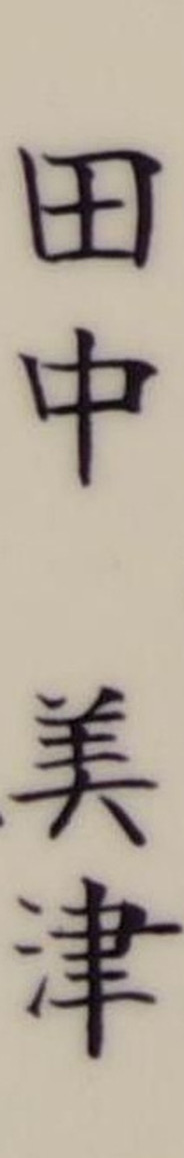田中美津
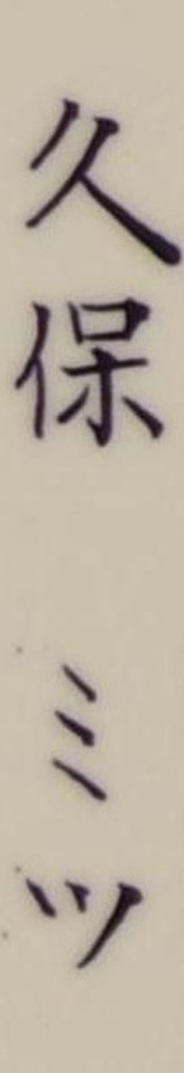久保ミツ
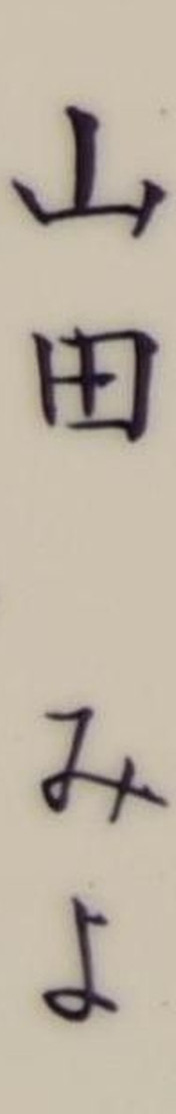山田みよ
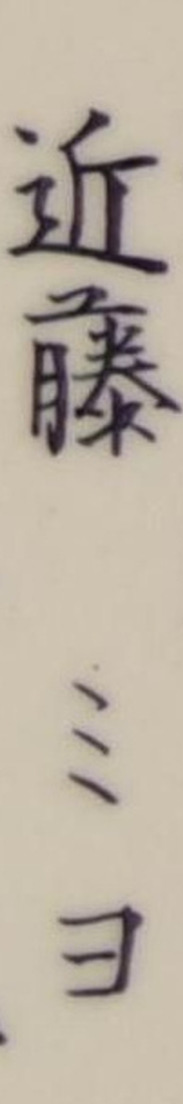近藤ミヨ

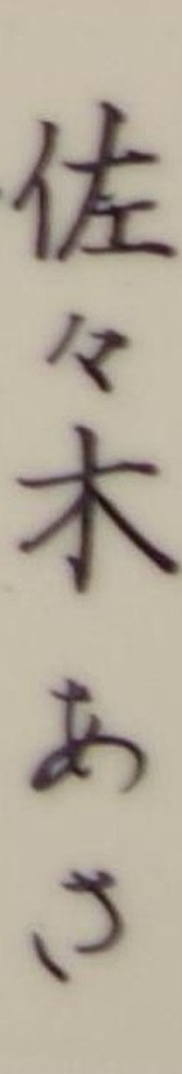佐々木あさ
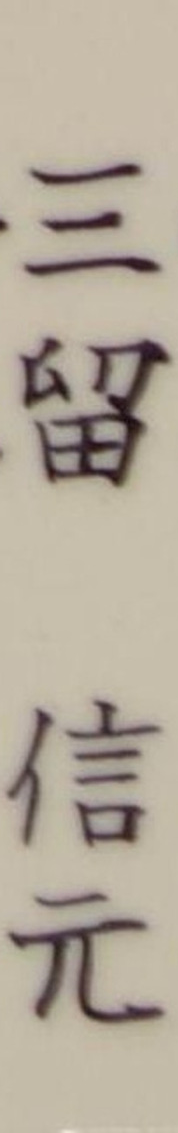三留信元
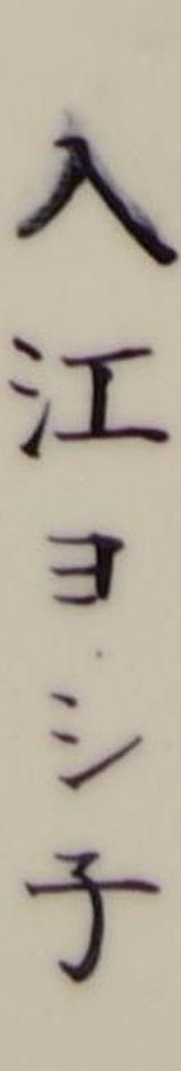入江ヨシ子
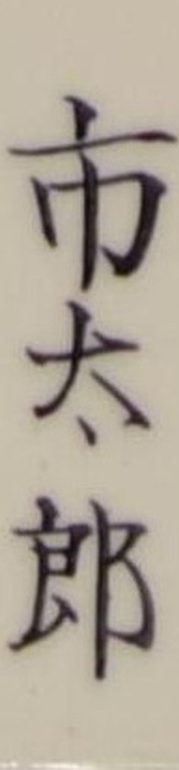市太郎
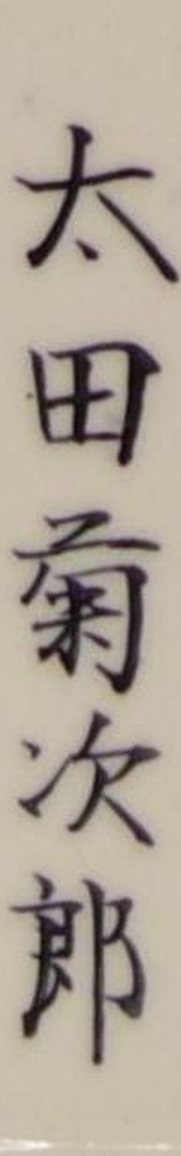太田菊次郎
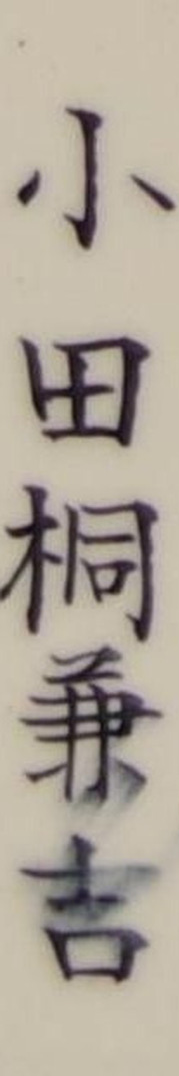小田桐兼吉
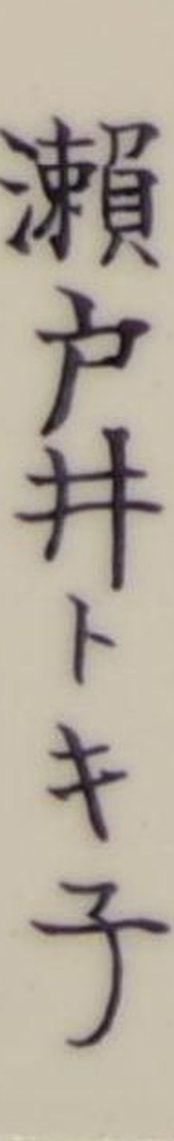瀨戸井トキ子
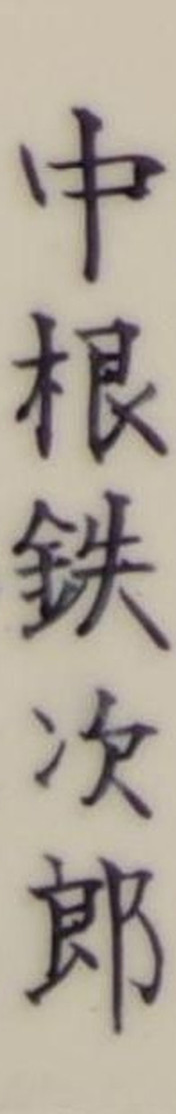中根鉄次郎
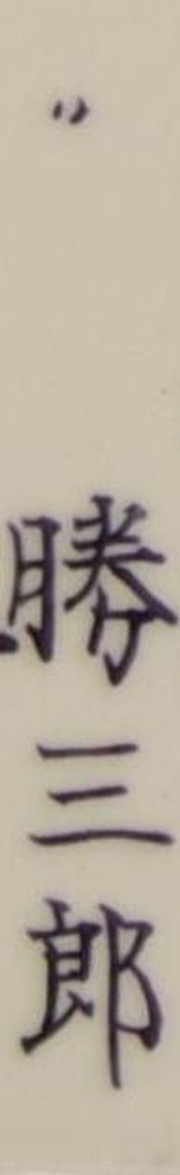勝三郎
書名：M~S
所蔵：高野山金剛峯寺
